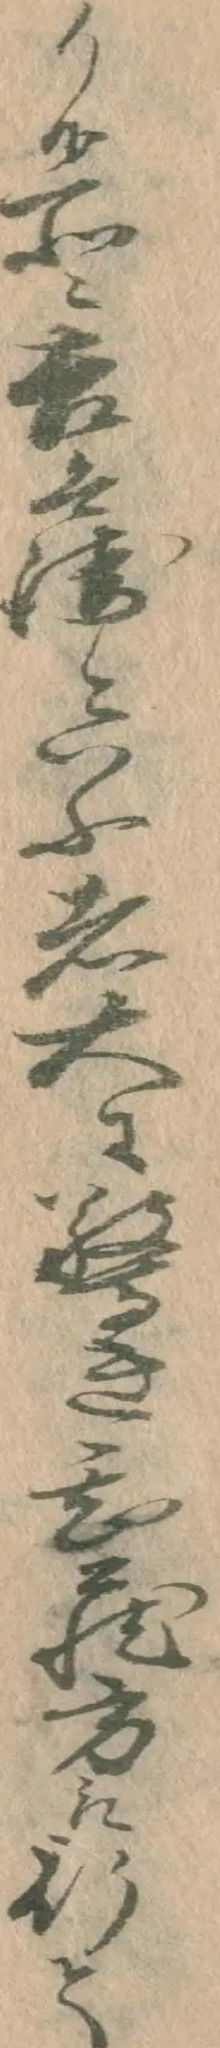り候所に吉兵衛といふ者大に驚き甚蔵方え行て
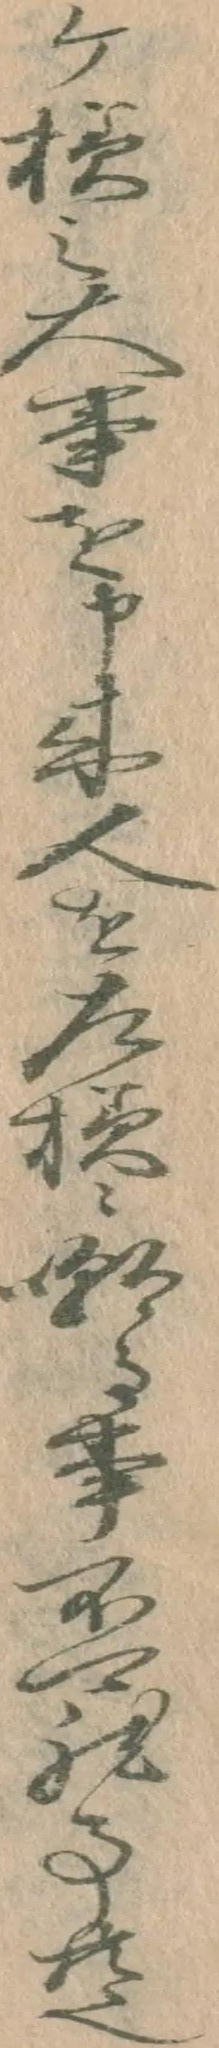ケ様之大事を申来人を左様に嘲る事不可然事共也
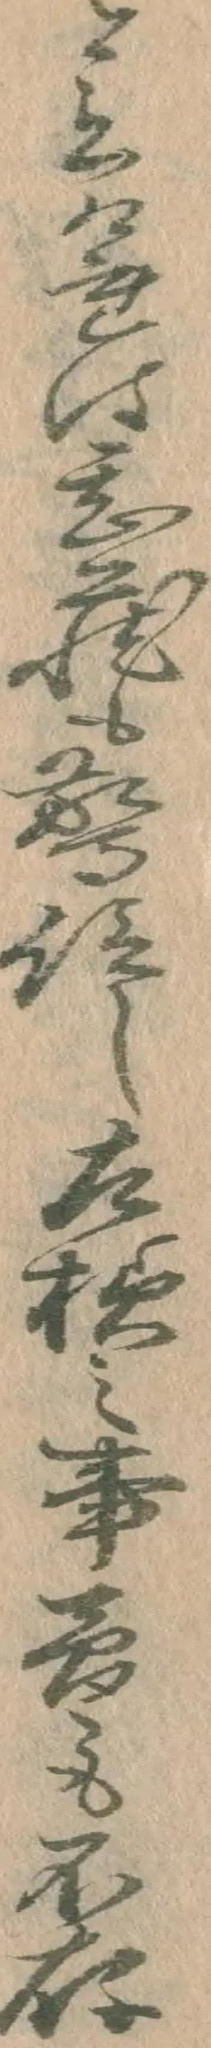と云けれは甚蔵も驚信し左様之事夢にも不存
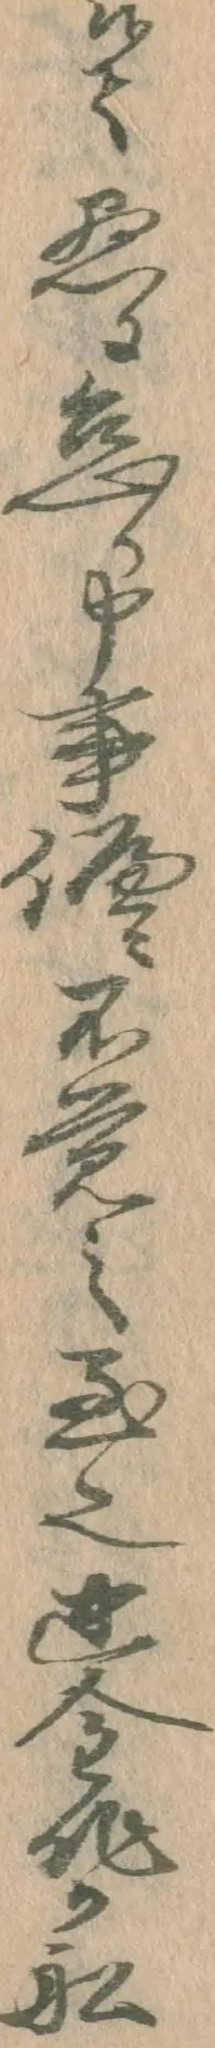候て懸に怠り申事偏に不覚之至也迚金作か船
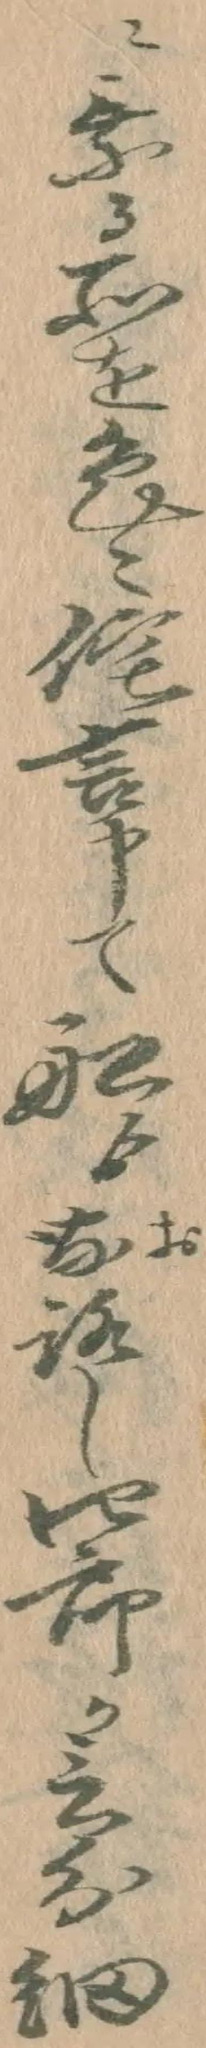に乗る所を色々侘事申て船ゟなろし四郎か云分細
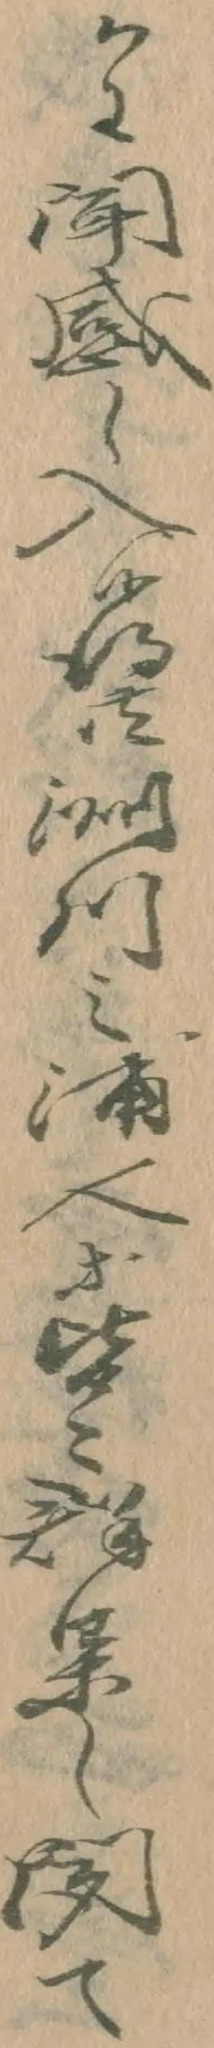かに聞感し入候得共洲川之浦人共等皆々群集し聞て
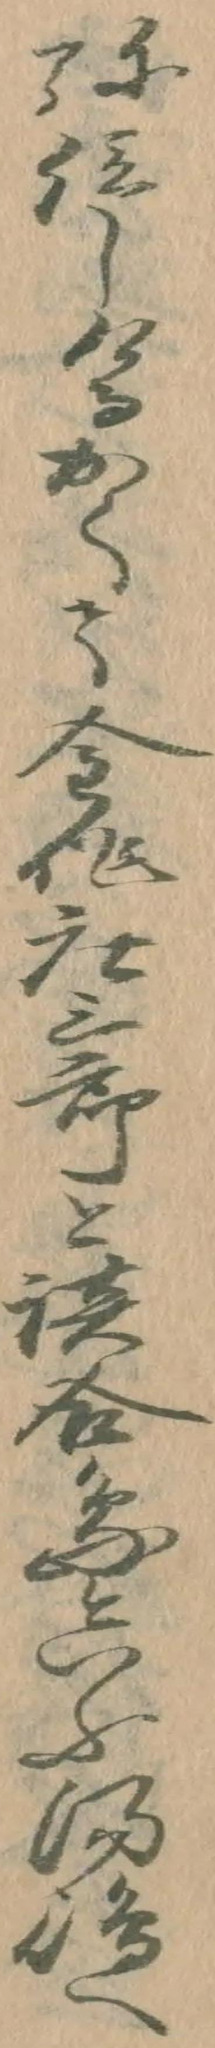弥信しけるかくて金作庄三郎と談合島といふ湯島へ
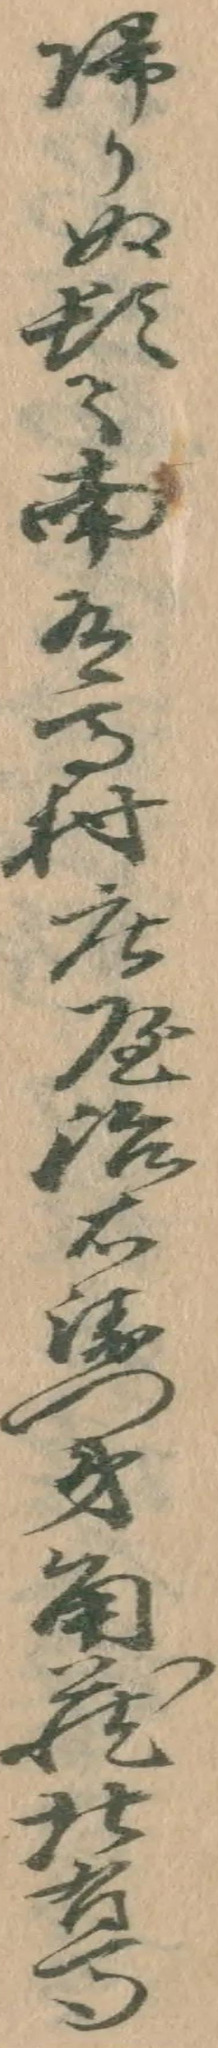帰りぬ頓て南有馬村庄屋治右衛門弟角蔵北有馬
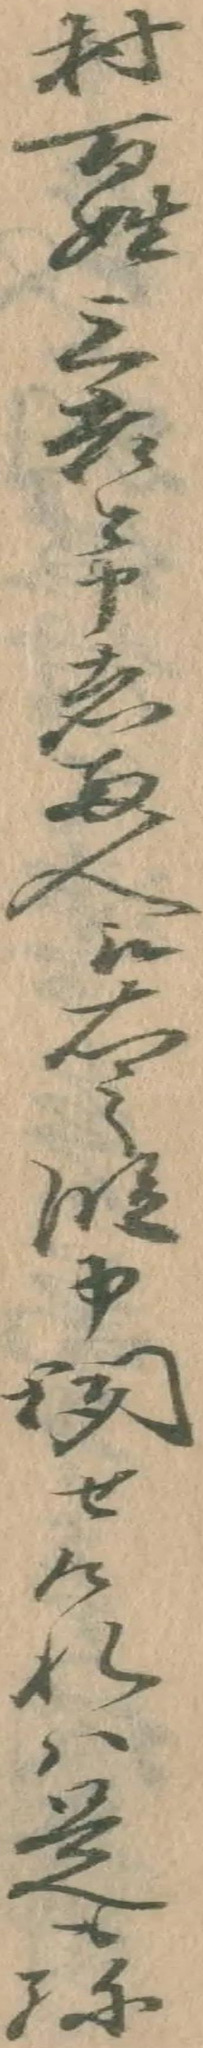村百姓三吉と申者両人え右之段申聞せけれは是も弥
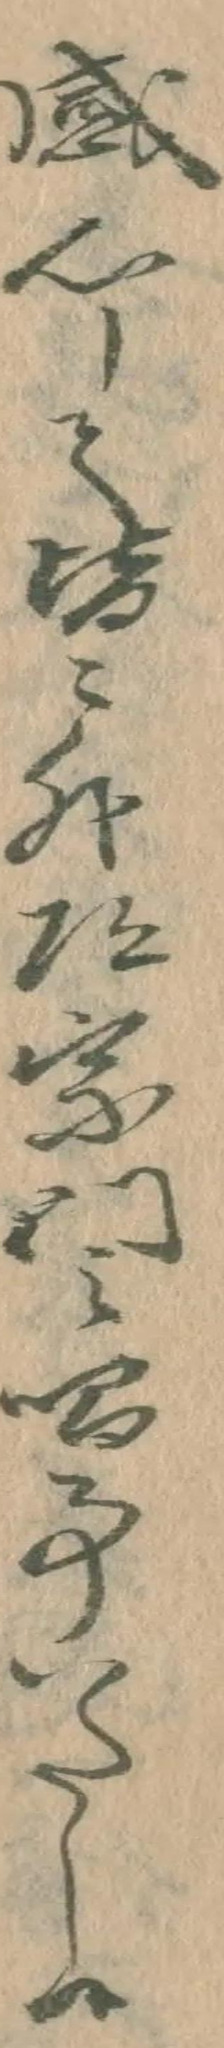感心して皆々外道宗門之間事いたし候
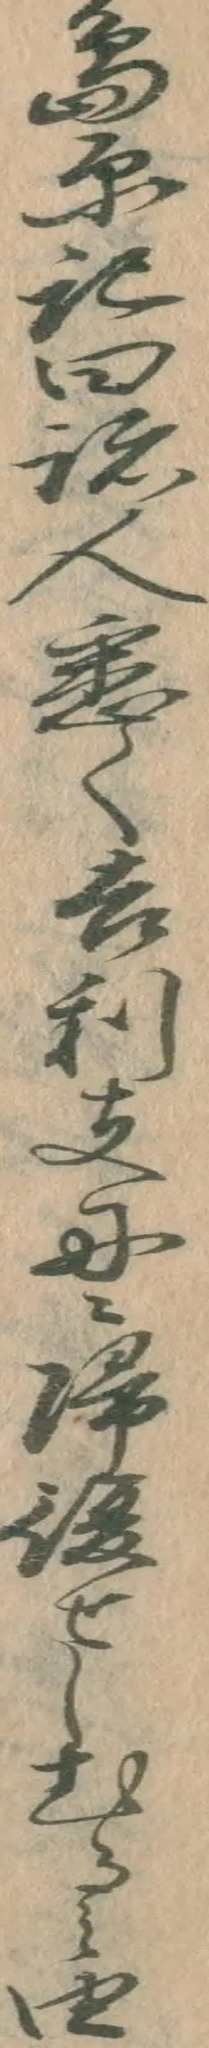島原記日諸人悉く吉利支丹に帰復せしむる之由
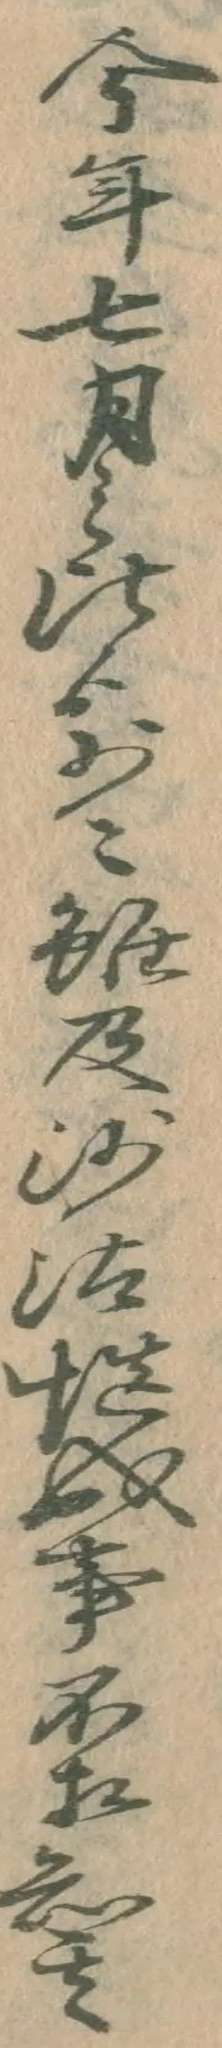今年七月之比ゟ少々雖及沙汰慎成事不相知其
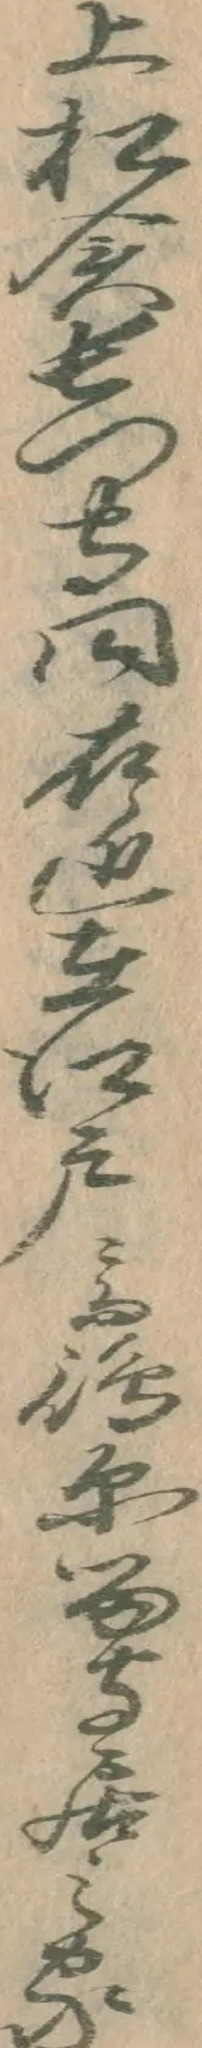上松倉長門守同右近在江戸に而島原留守居之家
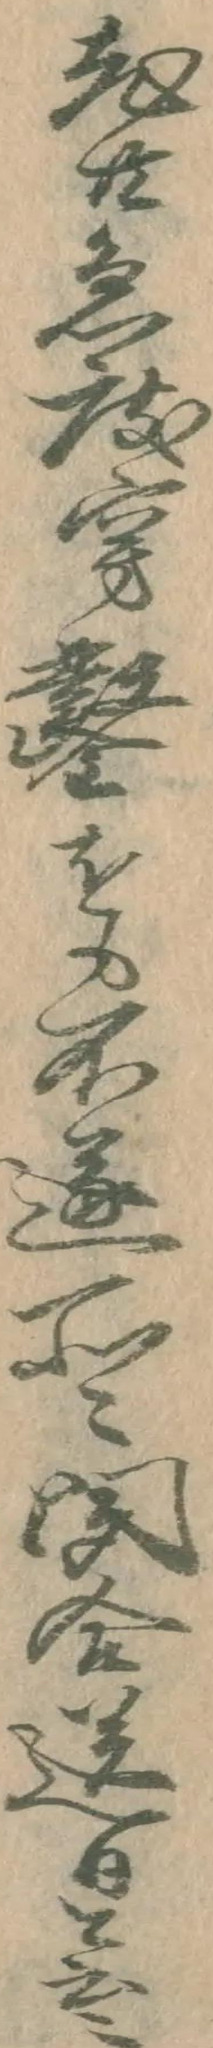老共急度穿鑿をも不遂所々聞合送日と云々
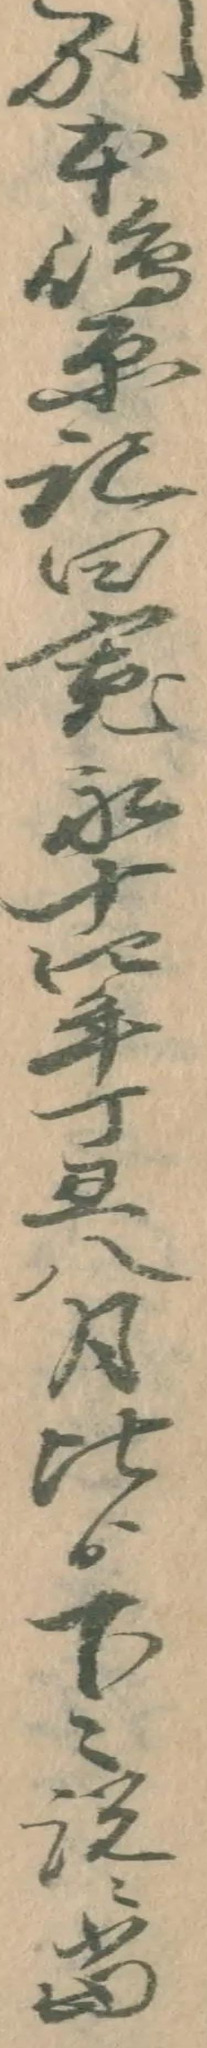別本島原記日寛永十四年丁丑八月比ゟ下々説に当

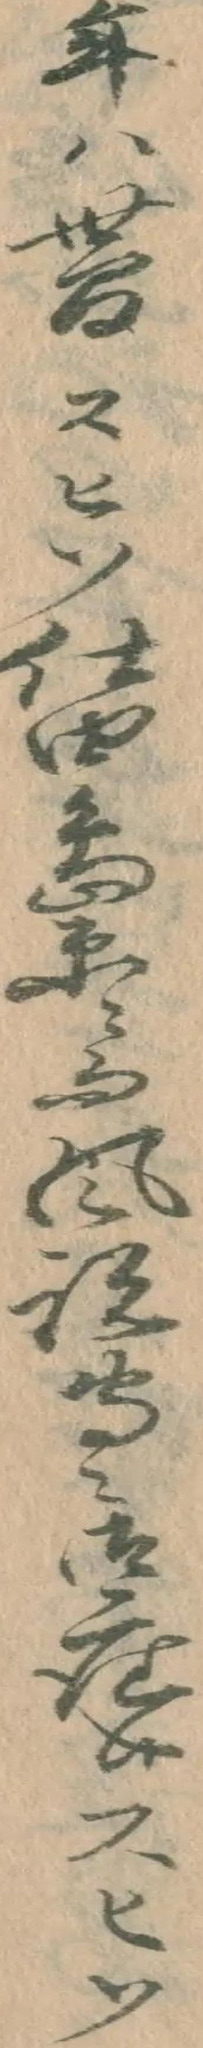年は世間スヒソ仕由島原に而風説守に御座候スヒソ
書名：切支丹御退治記 49巻. [1]
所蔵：国立国会図書館 National Diet Library, JAPAN
